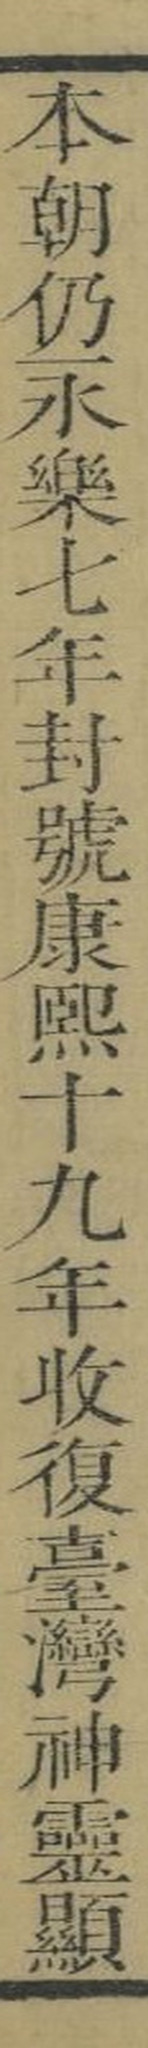本朝仍永樂七年封號康熙十九年收復臺灣神靈顯

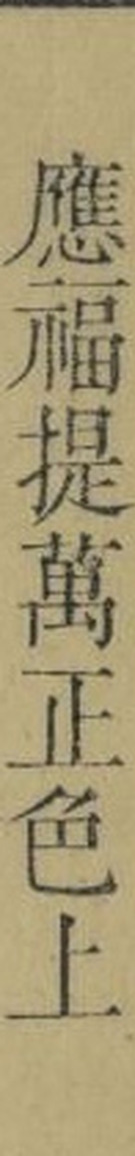應福提萬正色上
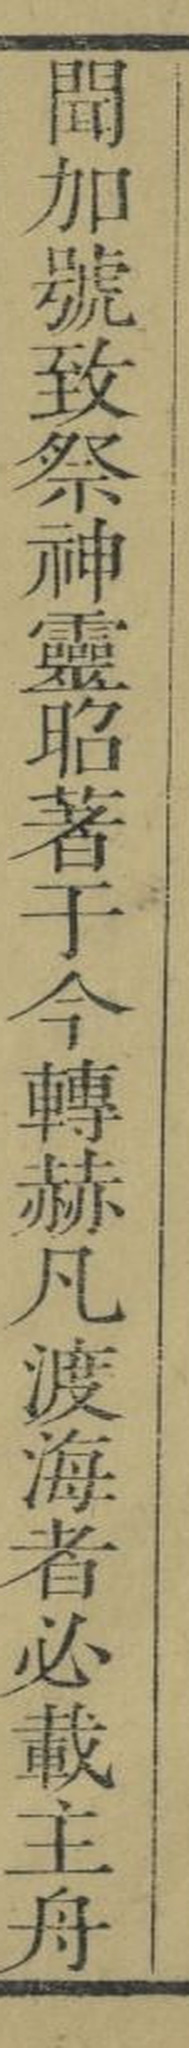聞加號致祭神靈昭著于今轉赫凡渡海者必載主舟
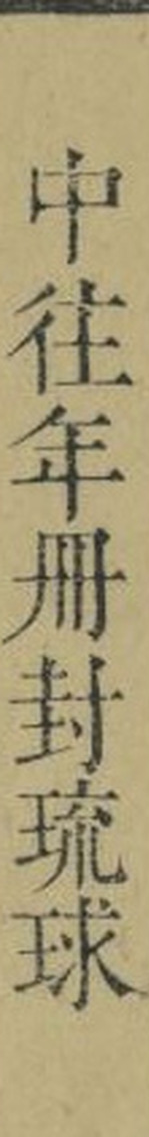中往年冊封琉球
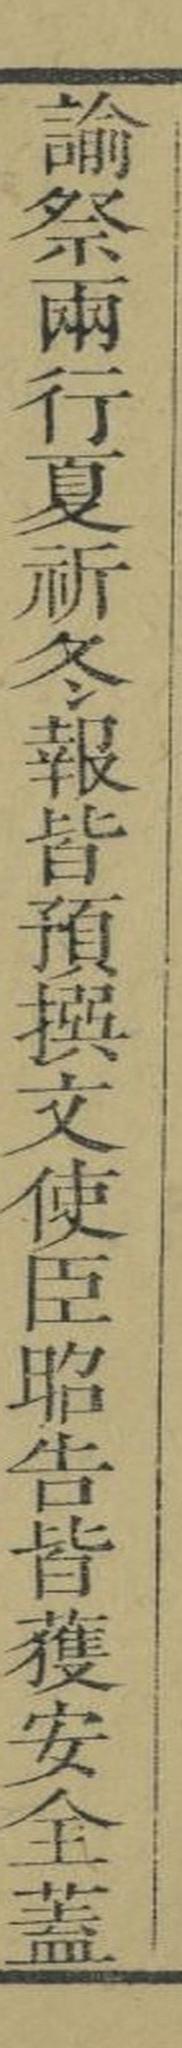諭祭兩行夏祈冬報皆預撰文使臣昭告皆獲安全蓋
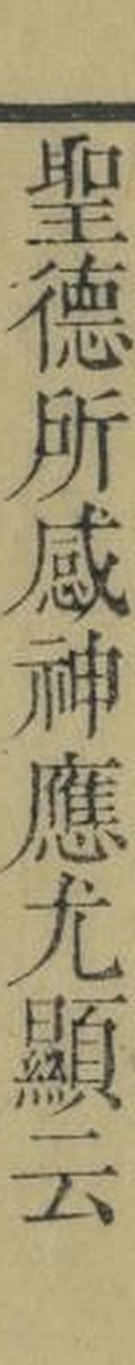聖德所感神應尤顯云
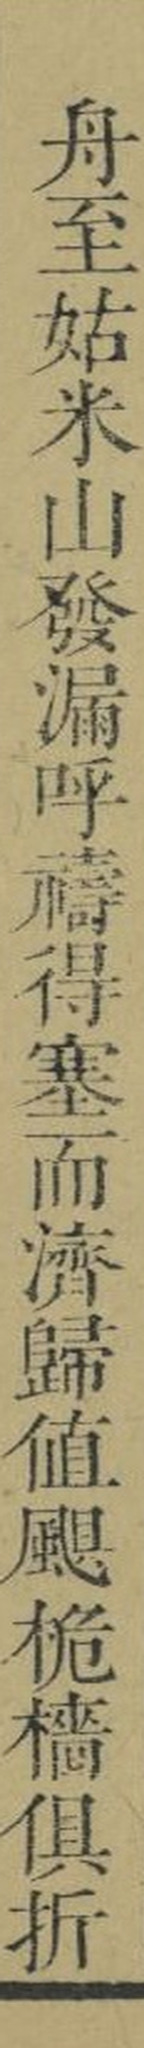舟至姑米山發漏呼禱得塞而濟歸値颶桅檣俱折
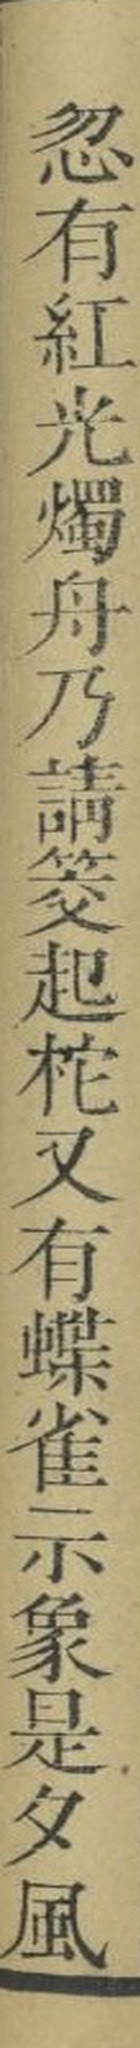忽有紅光燭舟乃請筊起柁又有蝶雀示象是夕風
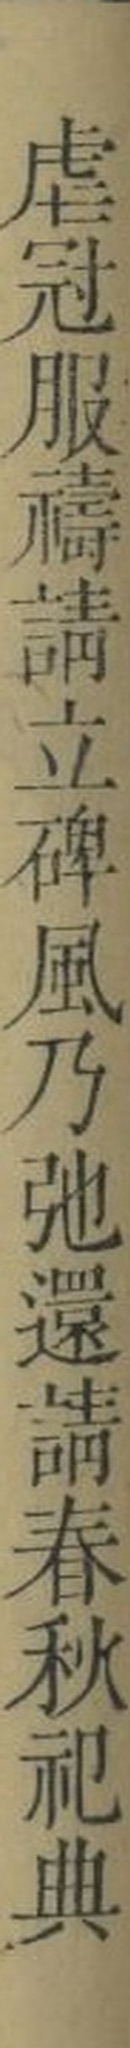虐冠服禱請立碑風乃弛還請春秋祀典
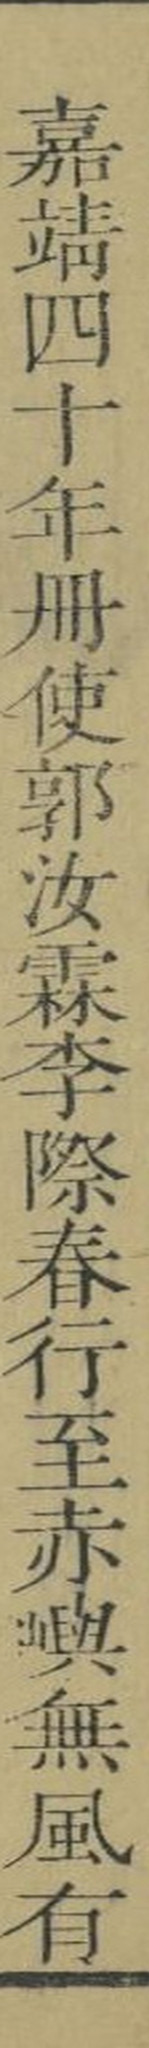嘉靖四十年冊使郭汝霖李際春行至赤嶼無風有
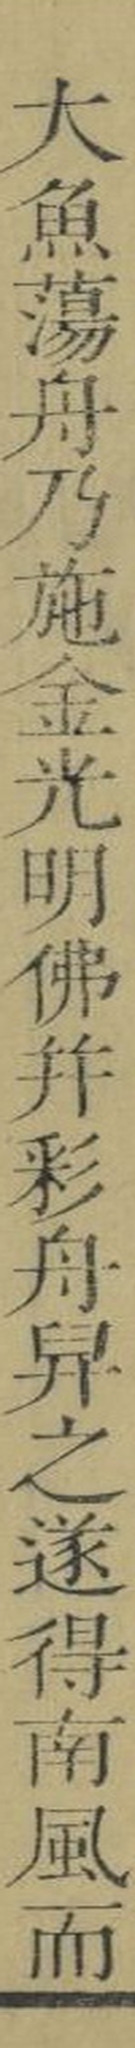大魚蕩舟乃施金光明佛并彩舟舁之遂得南風而
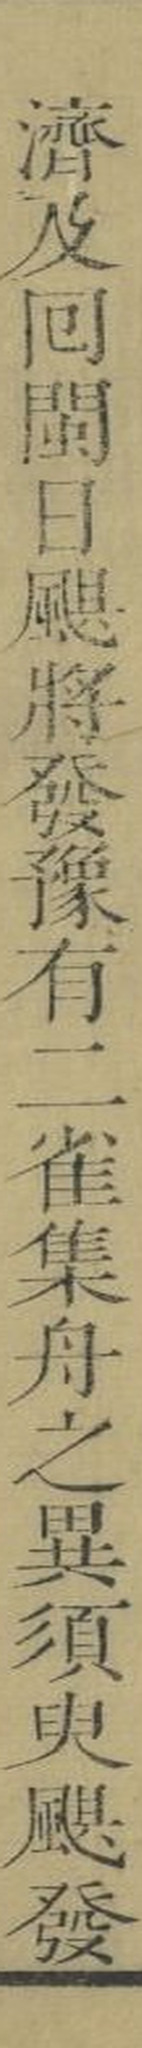濟及囘閩日颶將發豫有二雀集舟之異須臾颶發
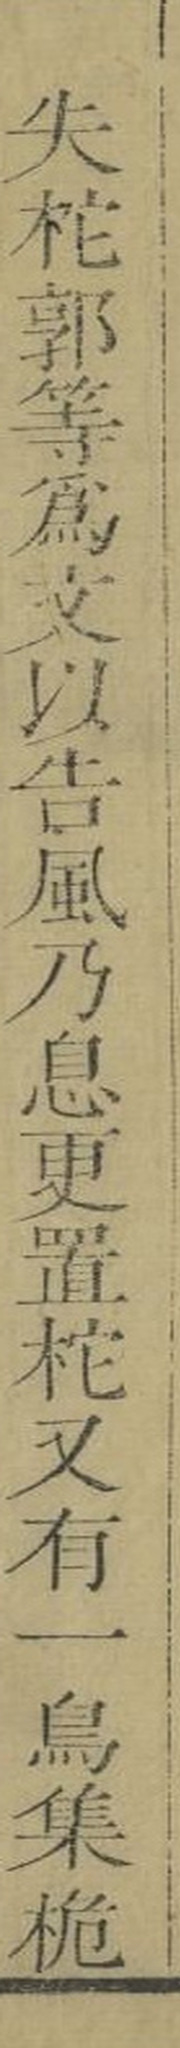失柁郭等爲文以告風乃息更置柁又有一鳥集桅
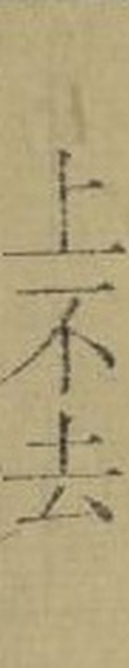上不去
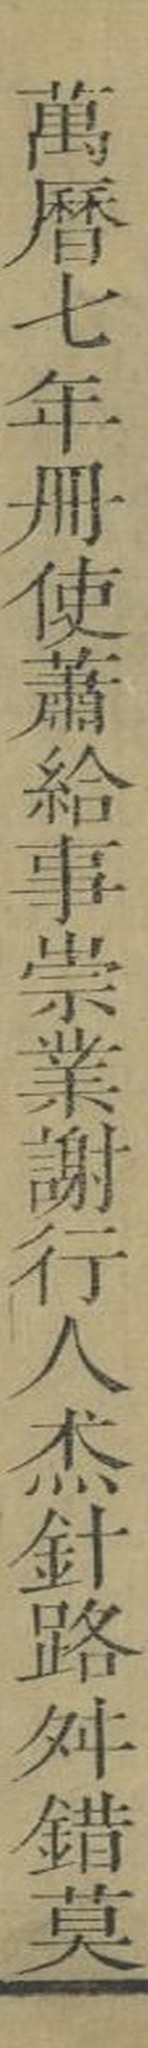萬曆七年冊使蕭給事崇業謝行人然針路舛錯莫
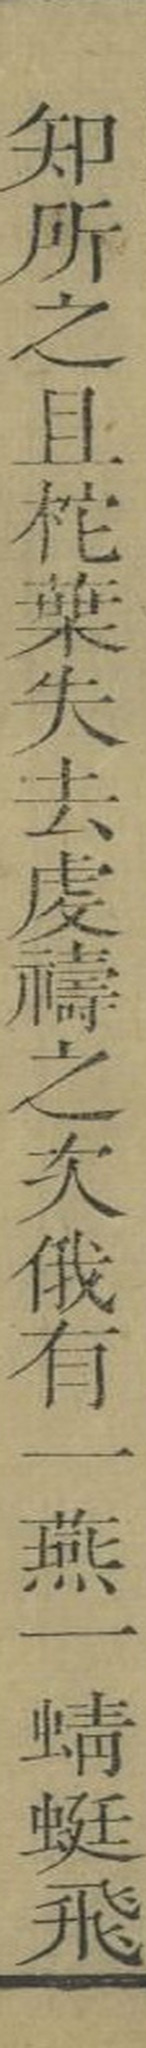知所之且柁葉失去䖍禱之次俄有一燕一蜻蜓飛
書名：中山伝信録 巻一
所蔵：University of the Ryukyus Library
